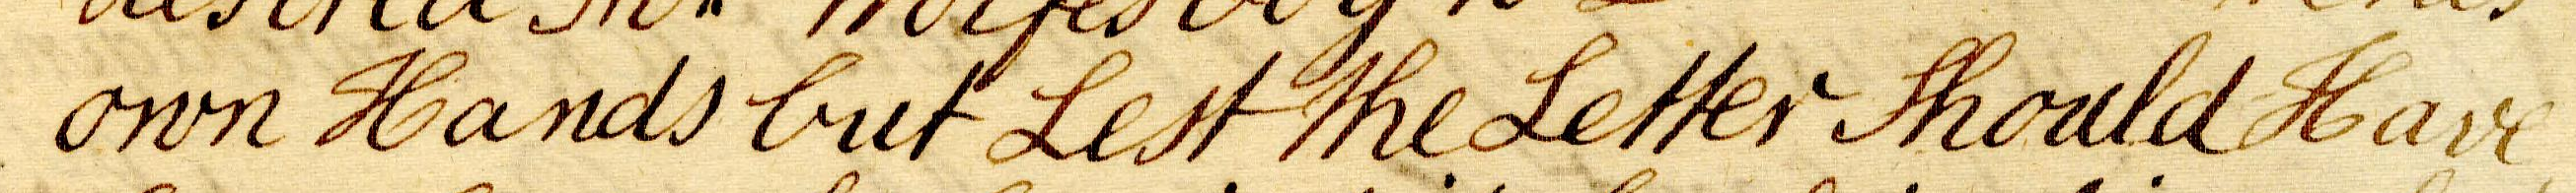own Hands but Lest the Letter Should Have
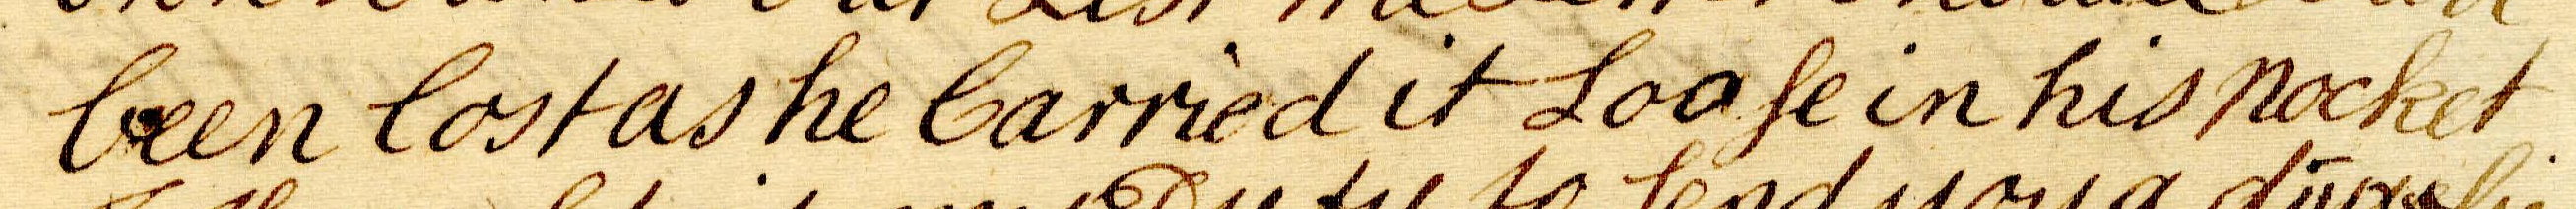been lost as he Carried it Loose in his pocket
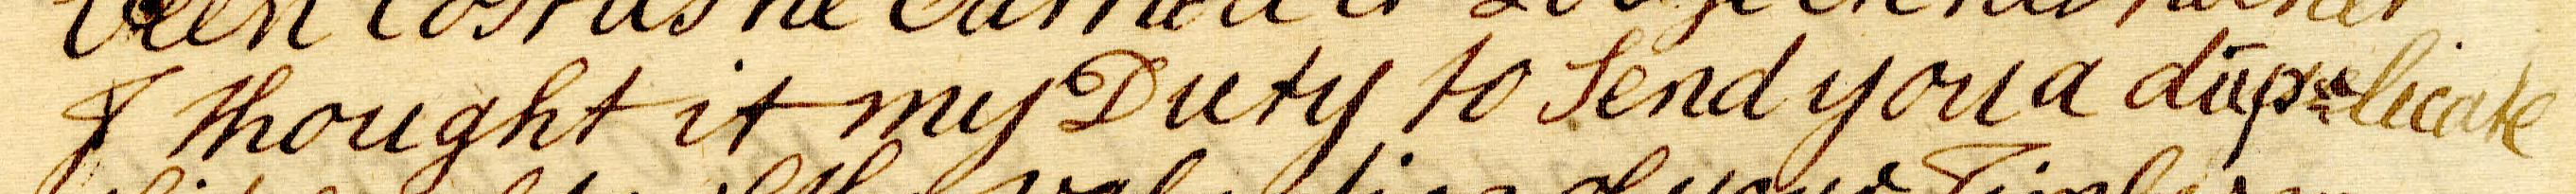I thought it my Duty to send you a duplicate
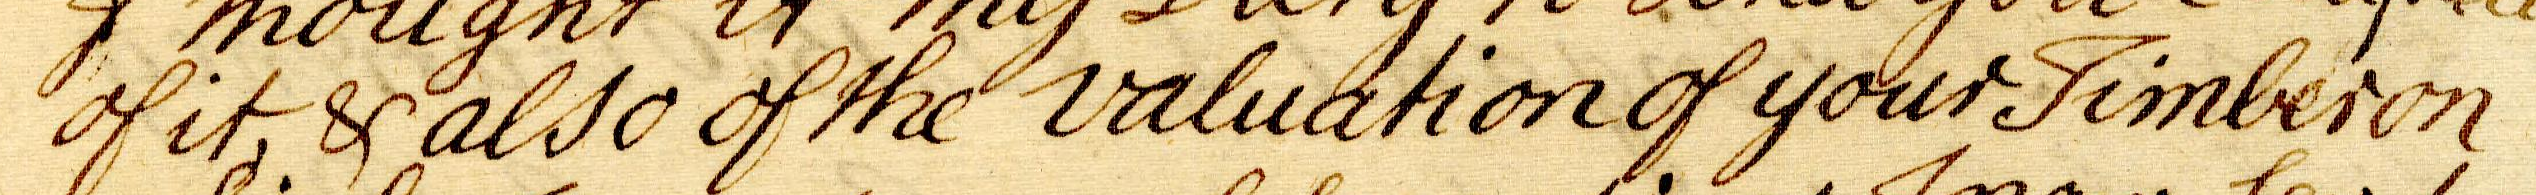of it, & also of the valuation of your Timber on
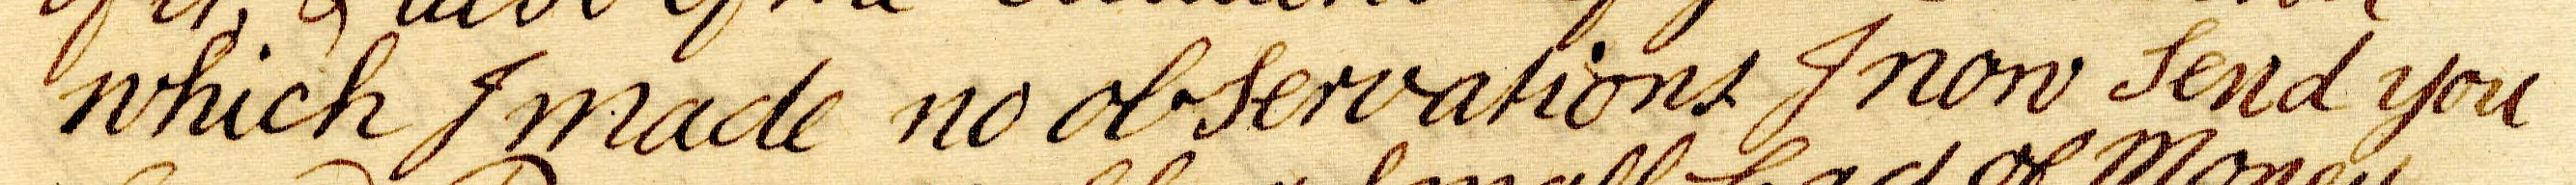which I made no observations I now Send you
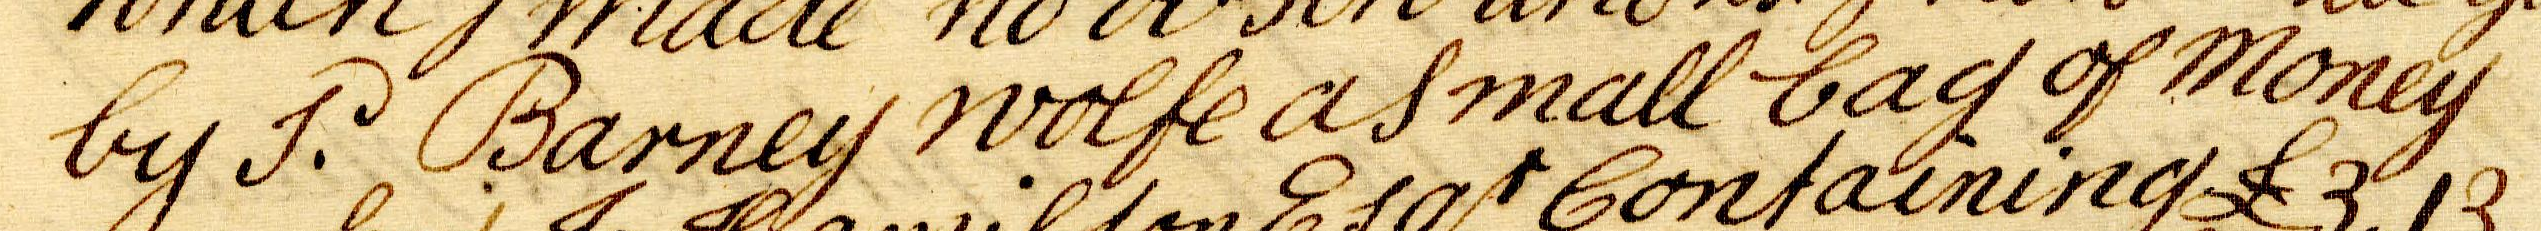by J^d. Barney Wolfe a Small bag of Money
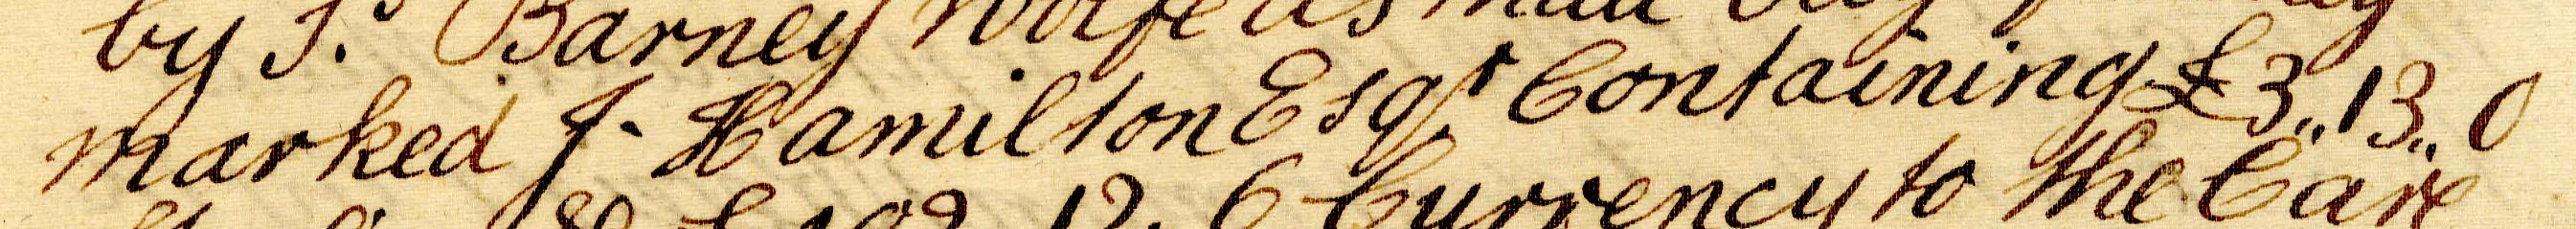Marked J. Hamilton Esq.^r Containing £3..13..0
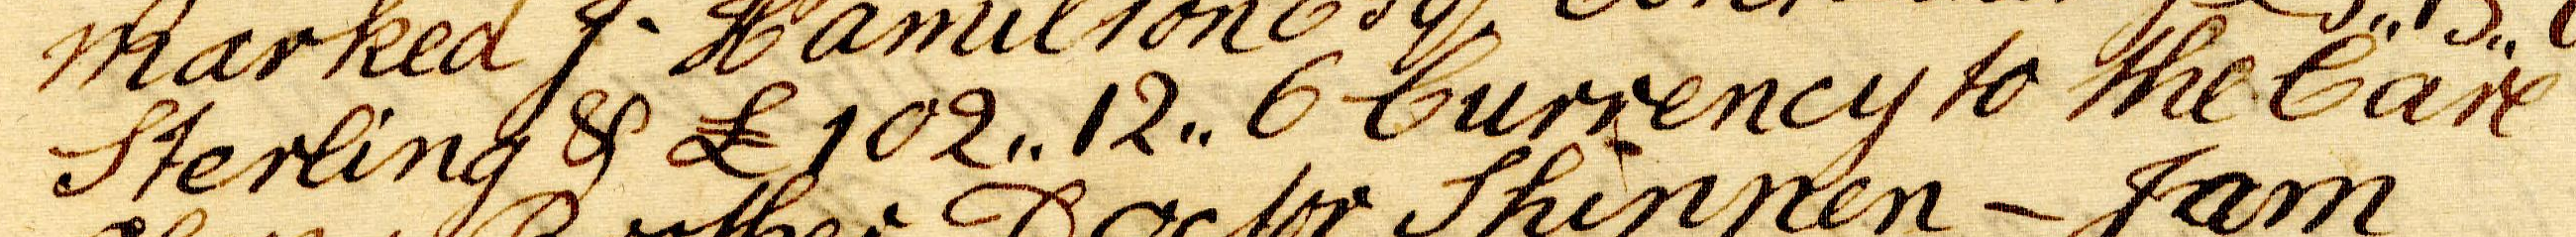Sterling & £102..12..6 Currency to the Care
